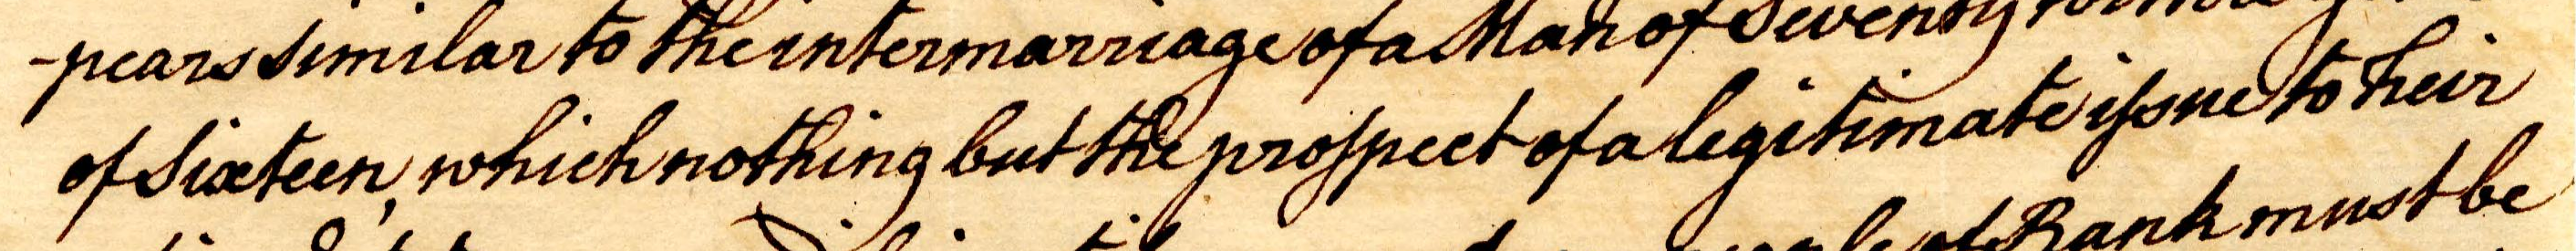of Sixteen, which nothing but the prospect of a legitimate issue to heir
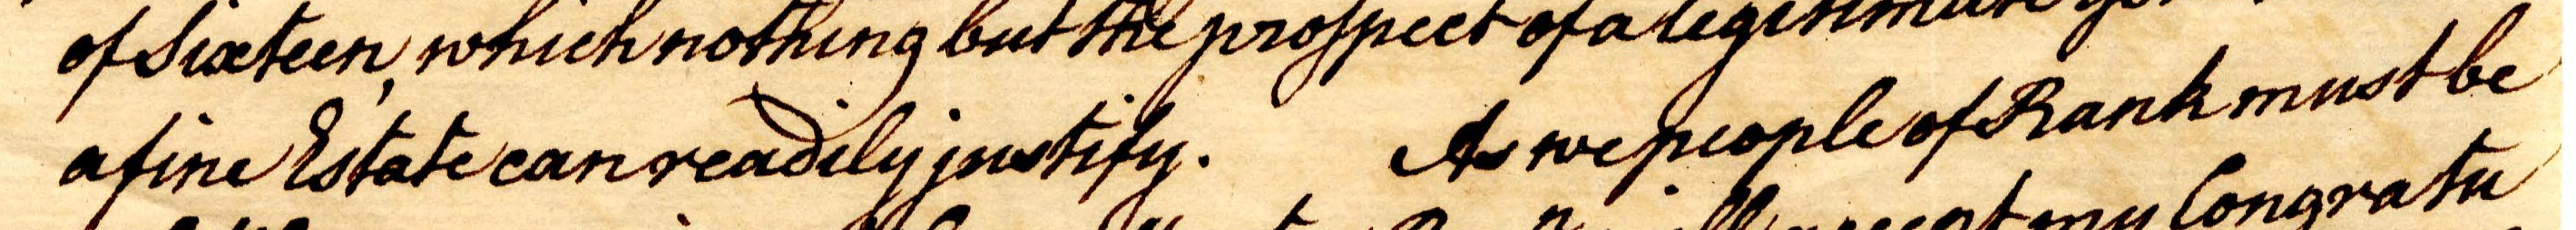a fine Estate can readily justify. As we people of Rank must be
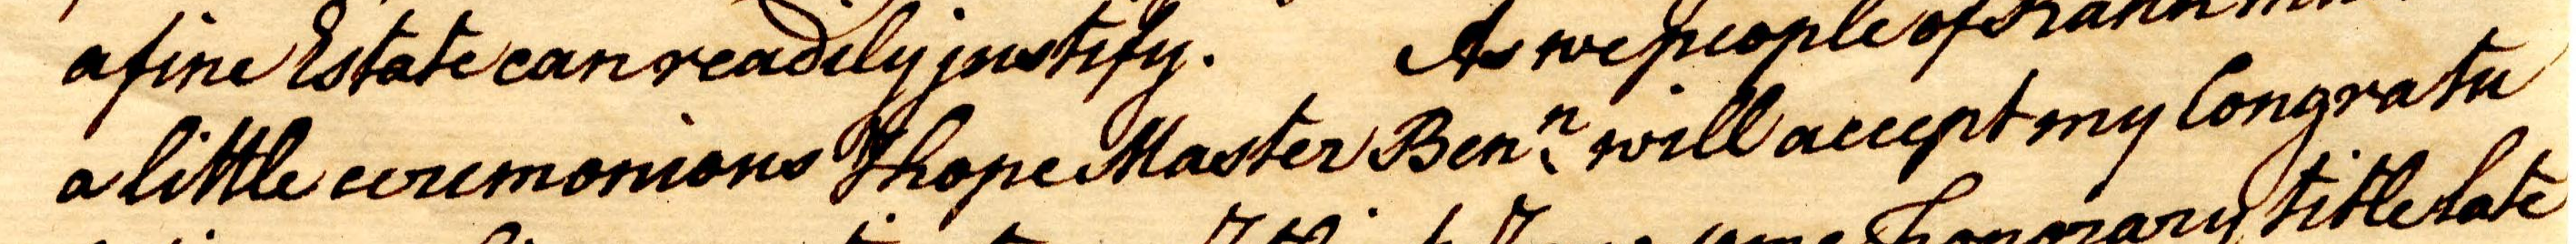a little ceremonious I hope Master Ben^. will accept my Congratu
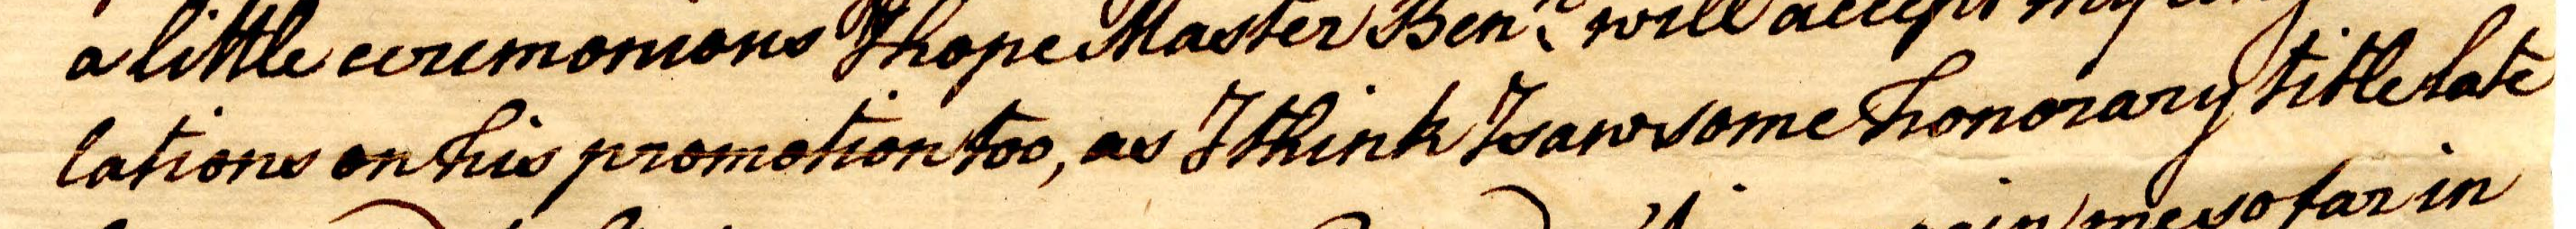lations on his promotion too, as I think I saw some honorary title late
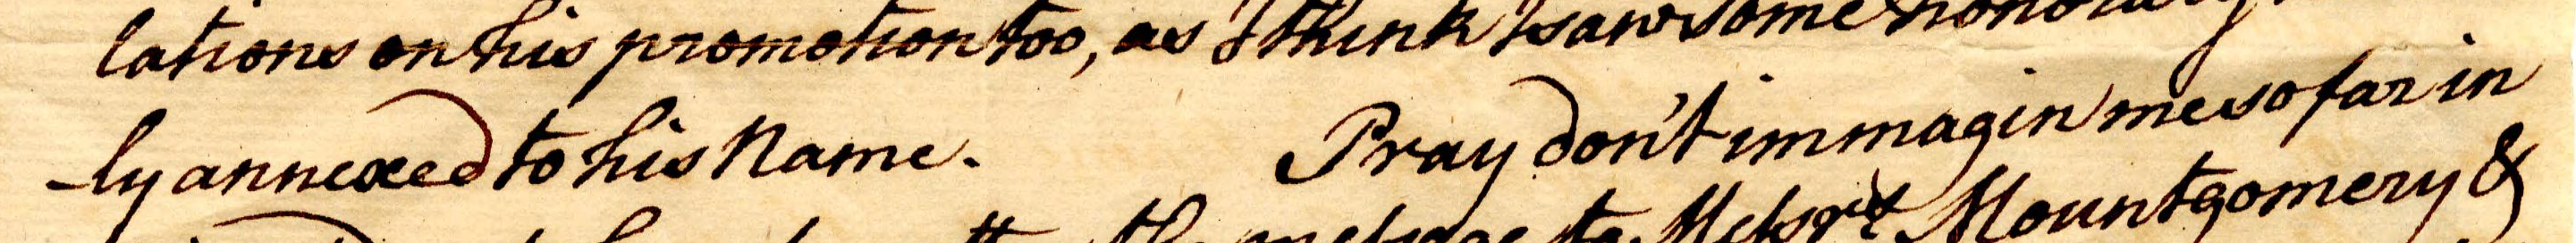-ly annexed to his Name. Pray don't immagin me so far in
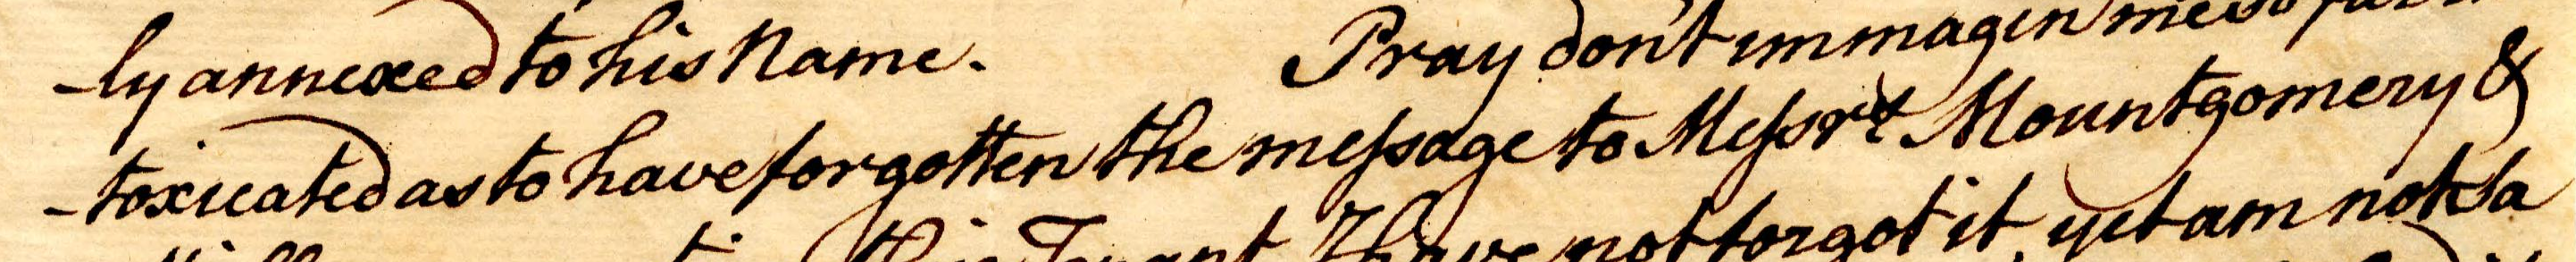-toxicated as to have forgotten the message to Messrt & Mountgomery &
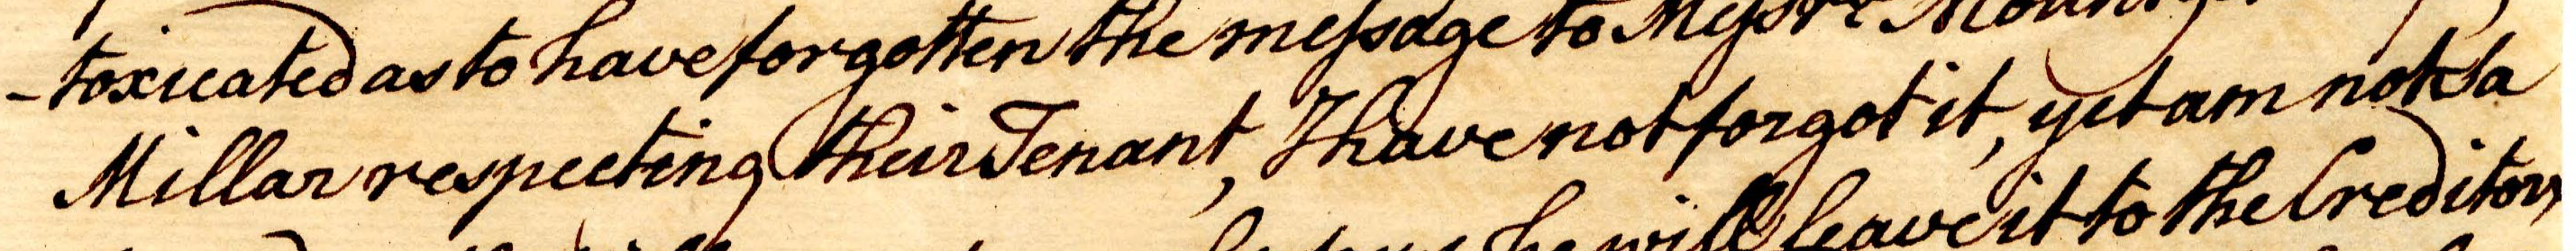Millar respecting their Tenant, I have not forgot it yet am not Sa
